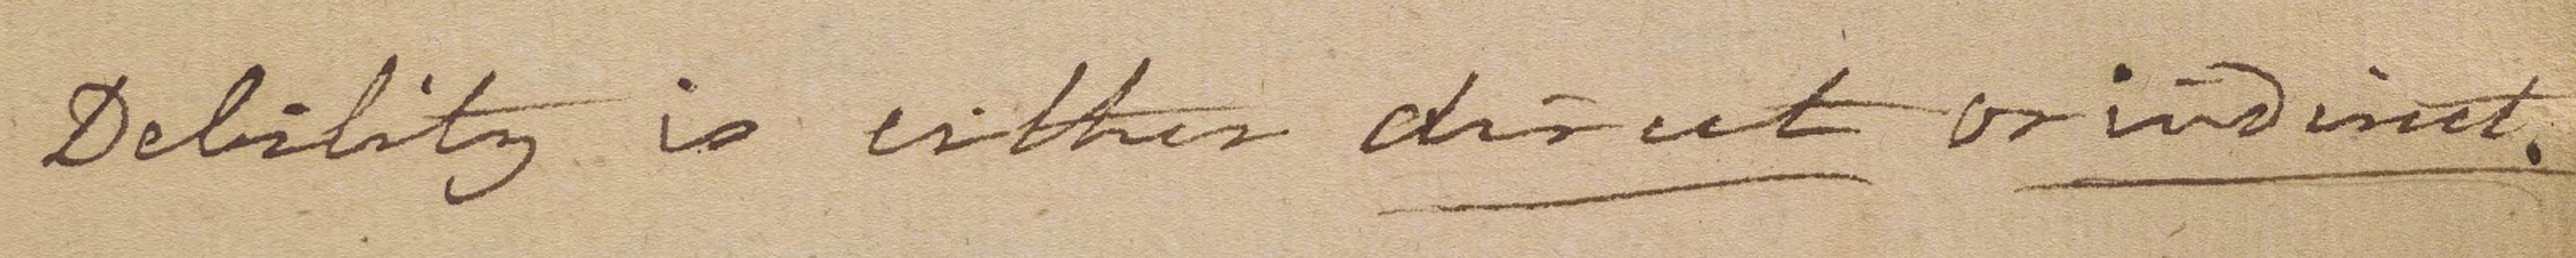Debility is either direct or indirect
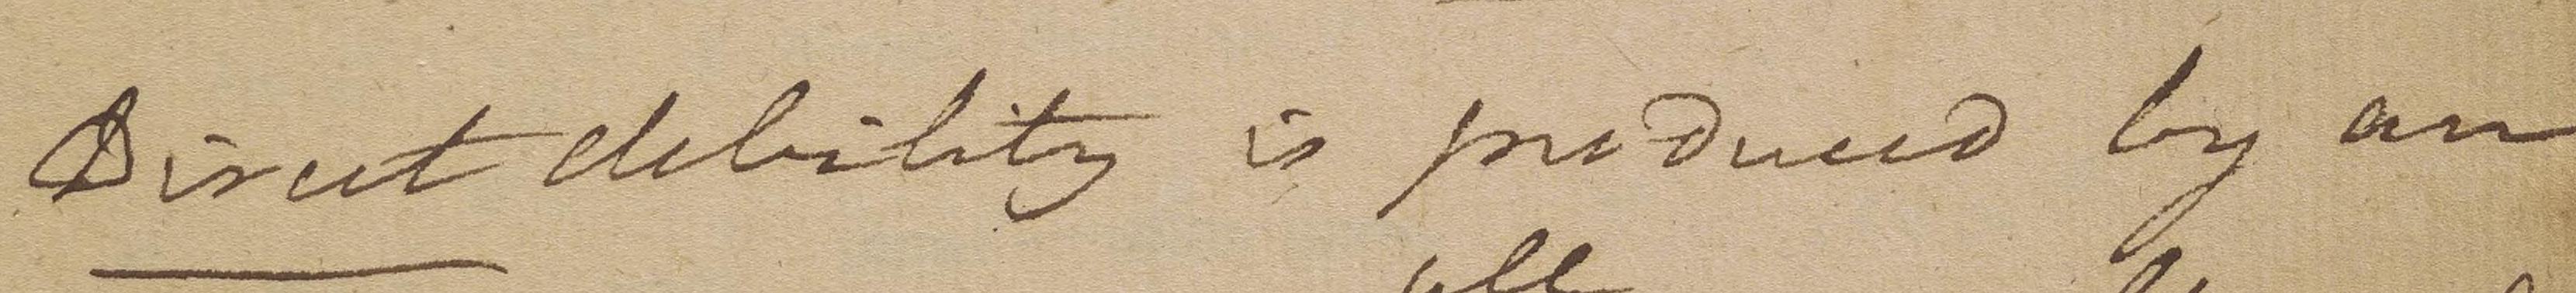Direct debility is produced by an
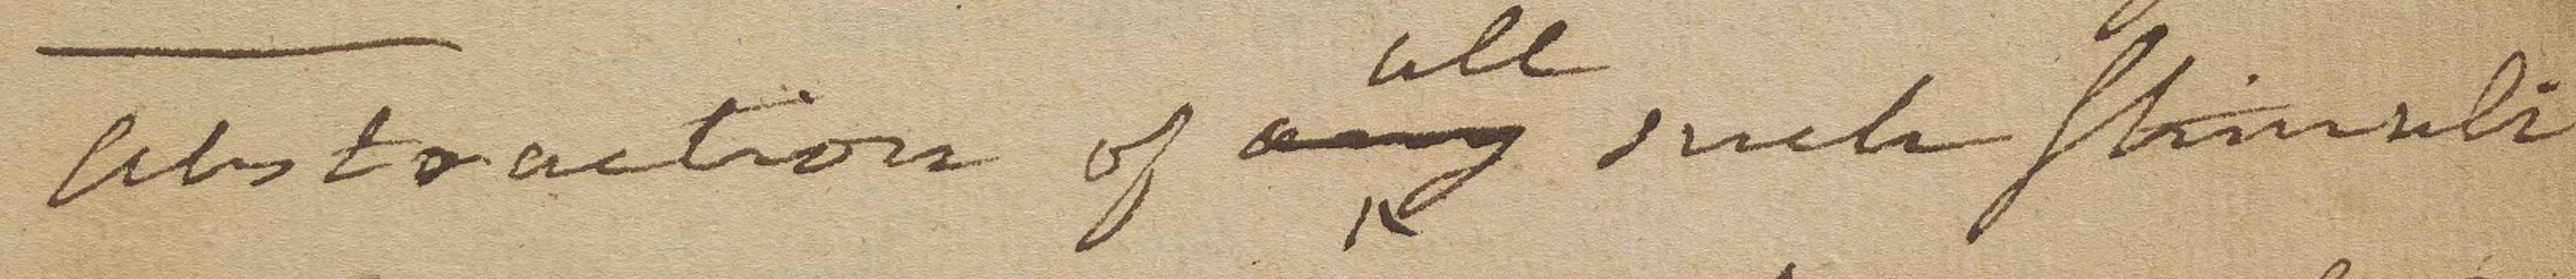abstraction of ^ [any] such stimuli
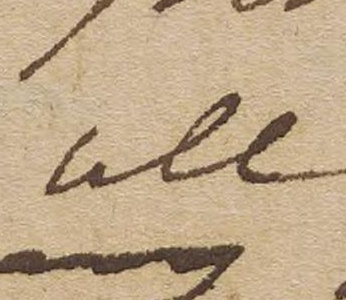all
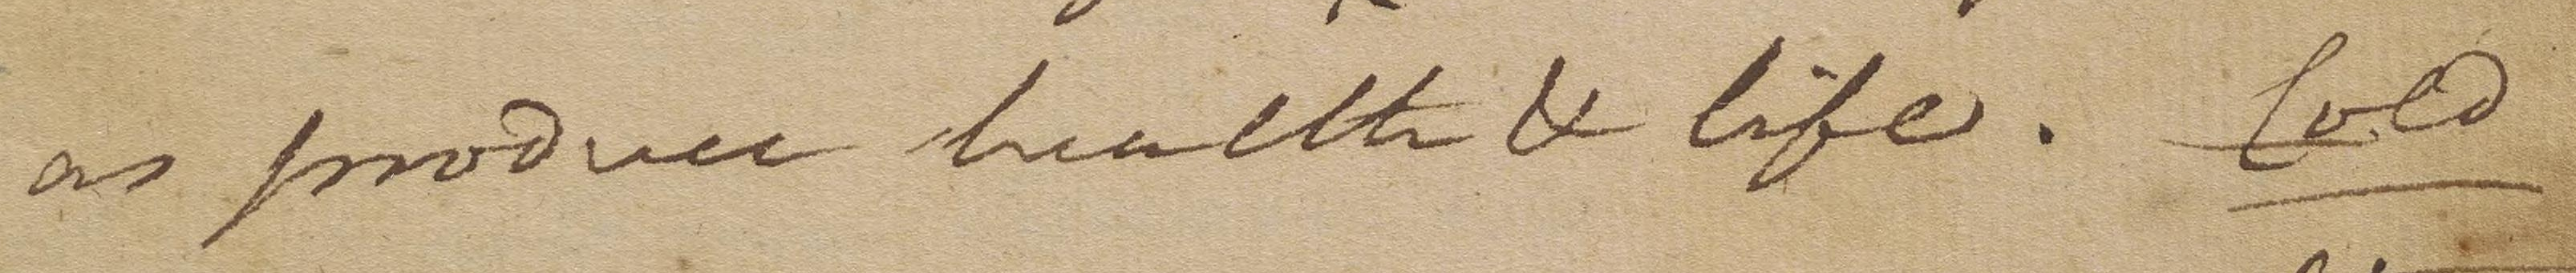as produce health & life. Cold
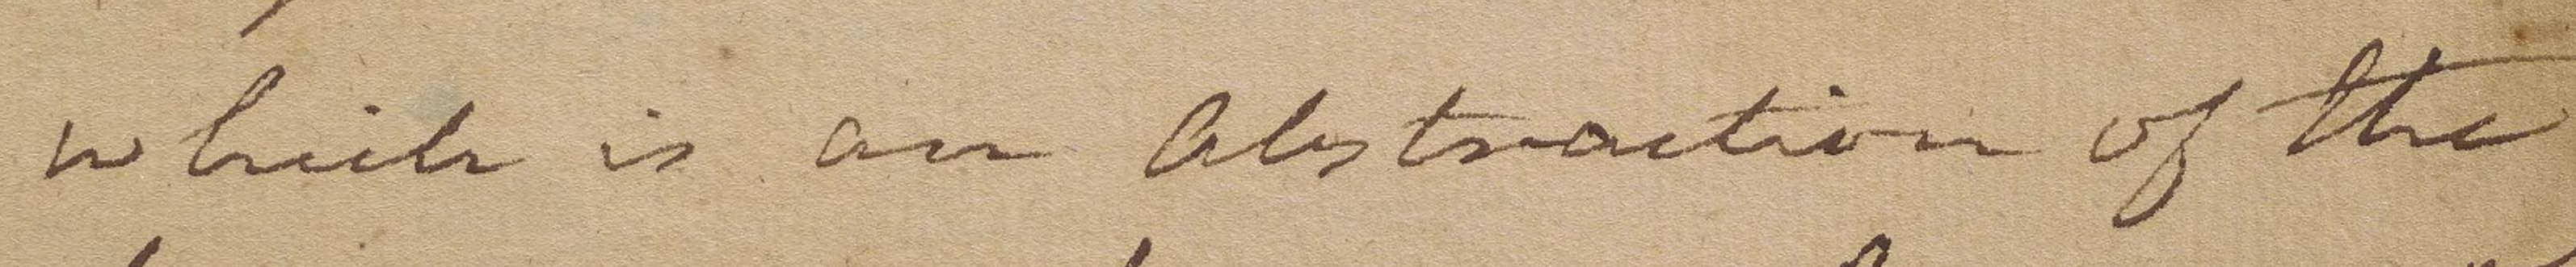which is an abstraction of the
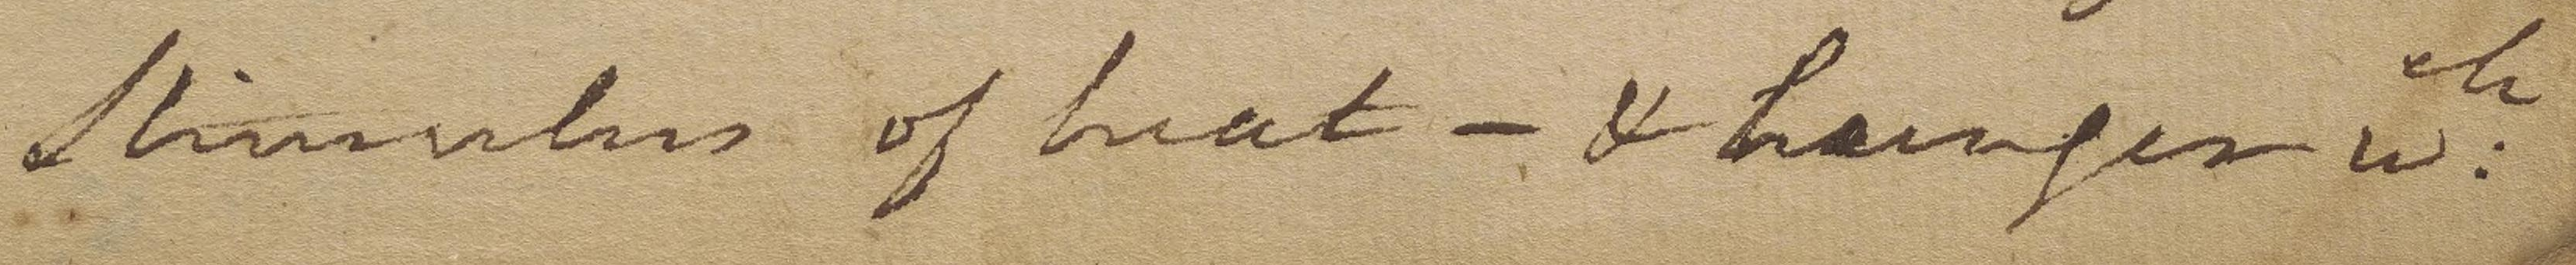stimulus of heat, & hunger w^ch:
